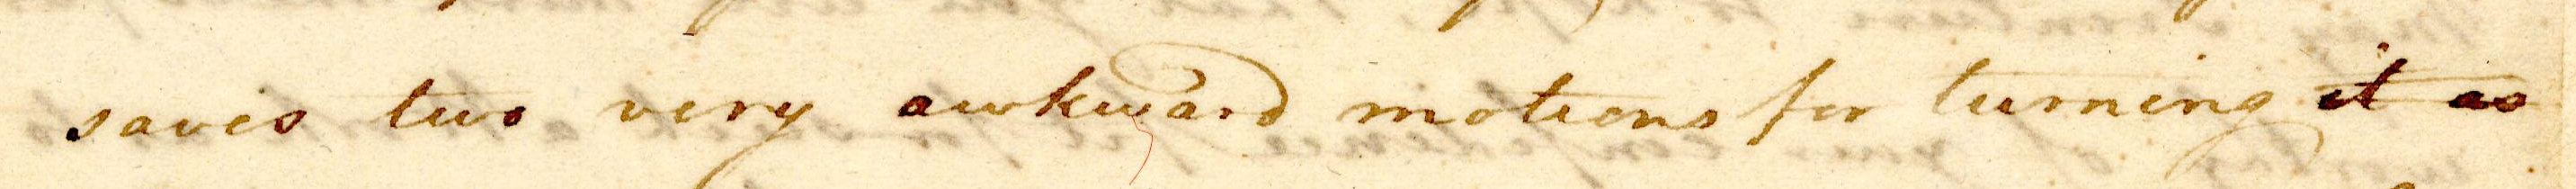saves two very awkward motions for turning it as
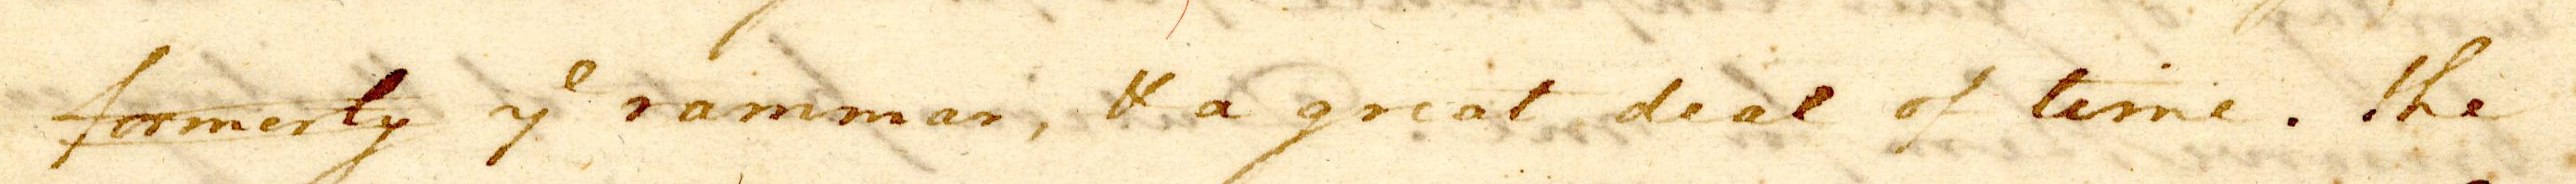formerly y^e rammar, & a great deal of time. the
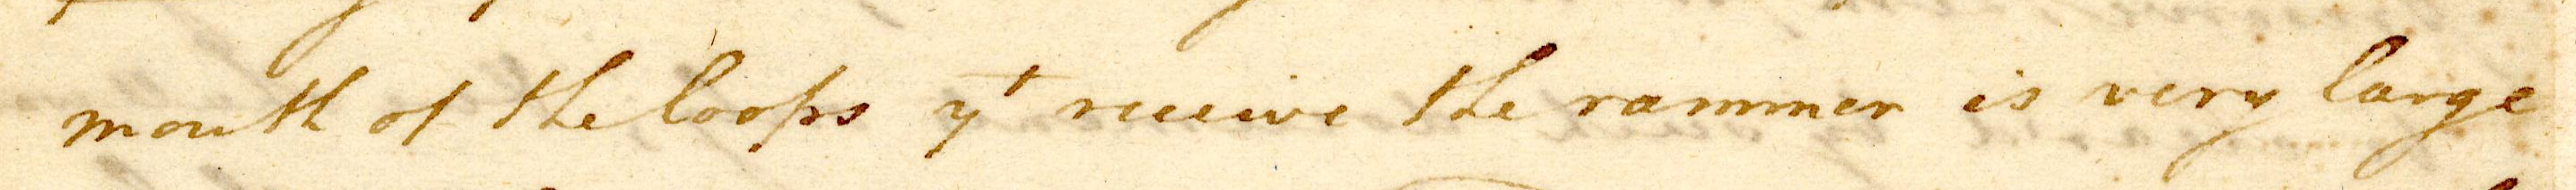mouth of the loops y^t receive the rammer is very large
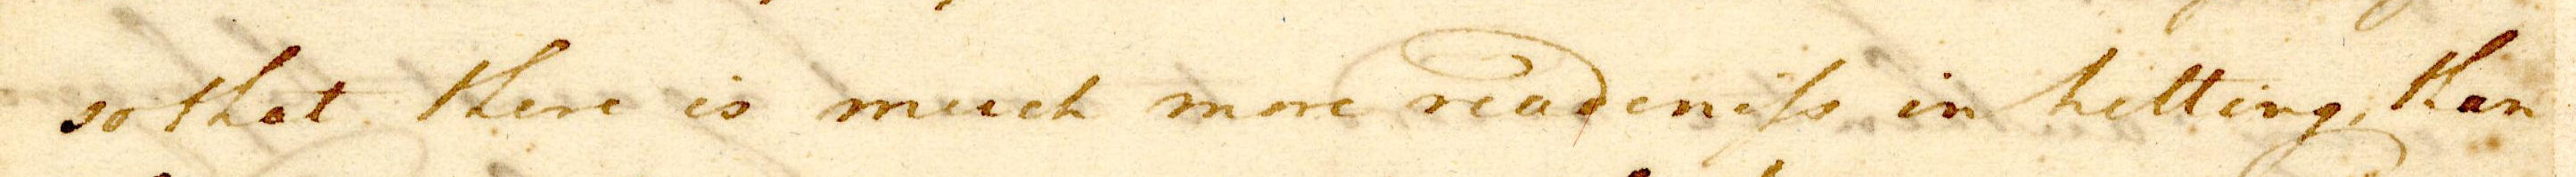so that there is much more readeniss in hitting than
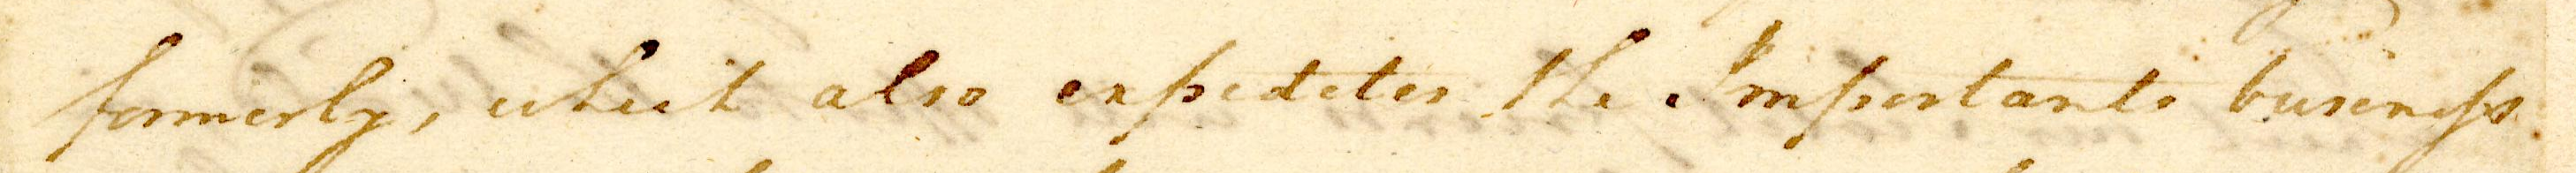formerly, which also expedites the Important business
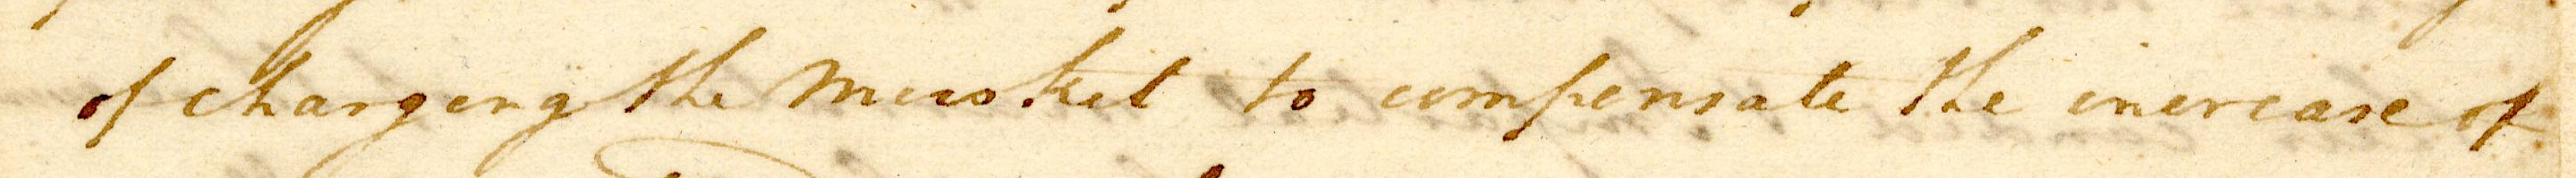of charging the musket to compensate the increase of
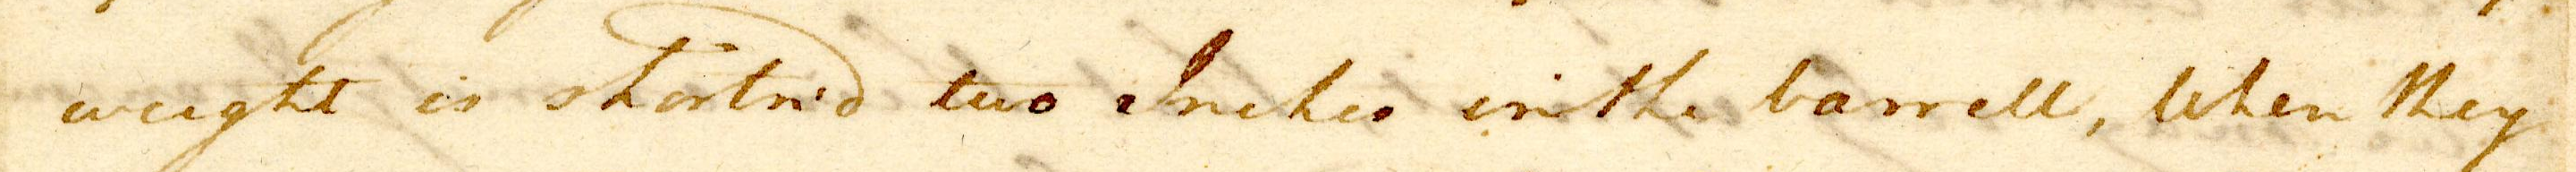weight is shortn'd two Inches in the barrell, when they
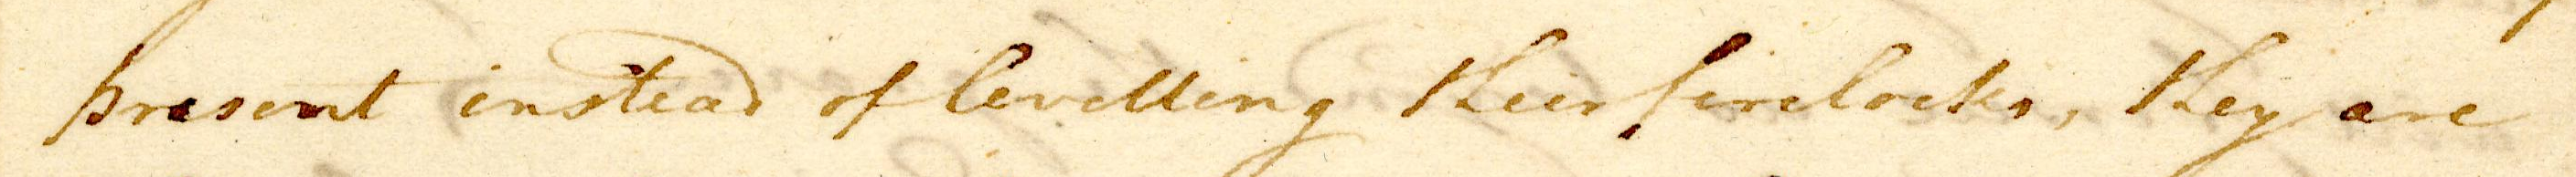present instead of levelling their firelocks, they are
